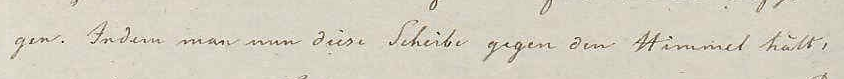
gen. Indem man nun diese Scheibe gegen den Himmel hält,
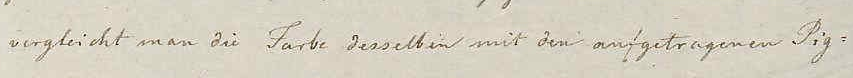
vergleicht man die Farbe desselben mit den aufgetragenen Pig-
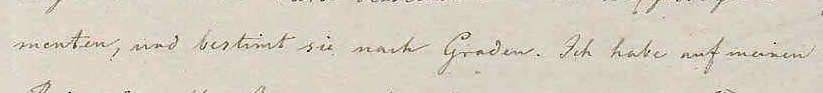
menten, und bestimt sie nach Graden. Ich habe auf meinen
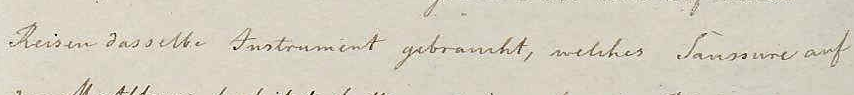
Reisen dasselbe Instrument gebraucht, welches Saussure auf
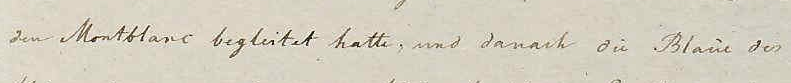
den Montblanc begleitet hatte, und danach die Bläue des
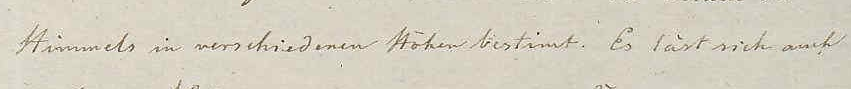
Himmels in verschiedenen Höhen bestimt. Es läst sich auch
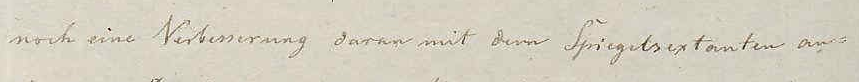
noch eine Verbesserung daran mit dem Spiegelsextanten an-
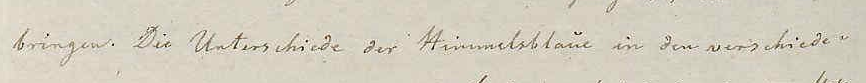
bringen. Die Unterschiede der Himmelsbläue in den verschiede-
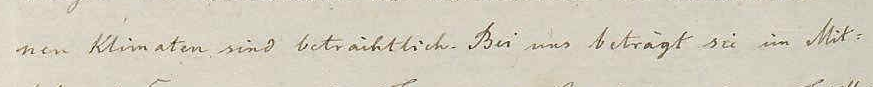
nen Klimaten sind beträchtlich. Bei uns beträgt sie im Mit-
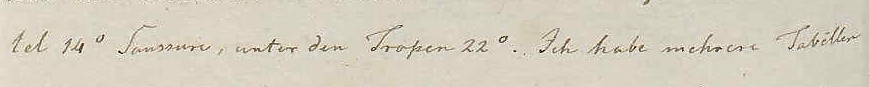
tel 14° Saussure, unter den Tropen 22°. Ich habe mehrere Tabellen
